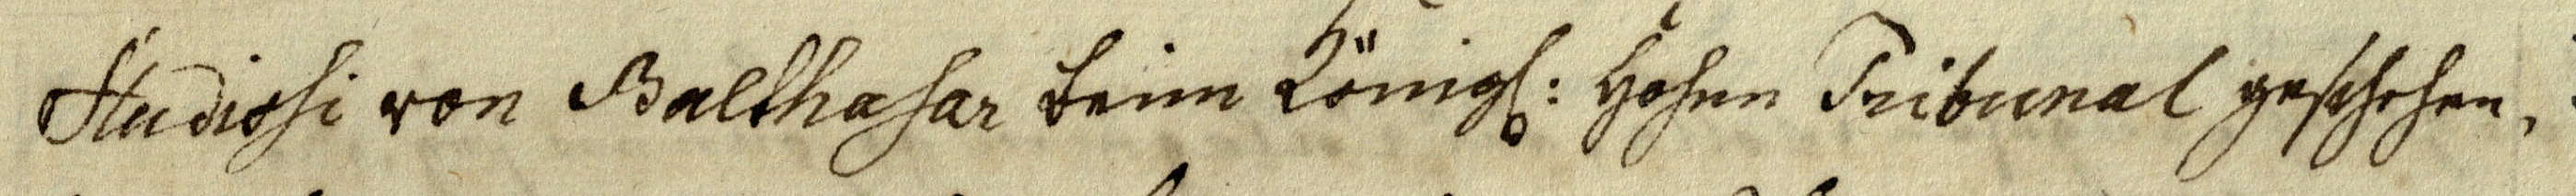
Studiosi von Balthasar beim Königl. Hohen Tribunal geschehen,
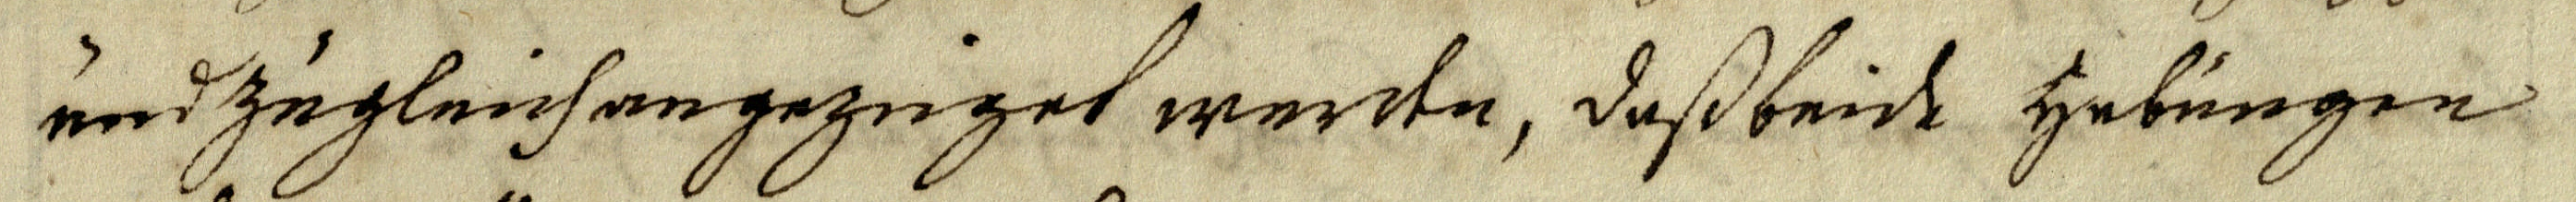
und zugleich angezeigt werden, daß beide Hebungen
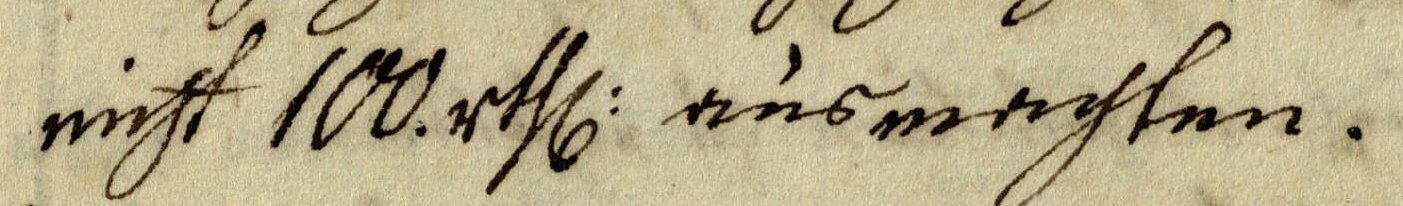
nicht 100. rtl. ausmachten.
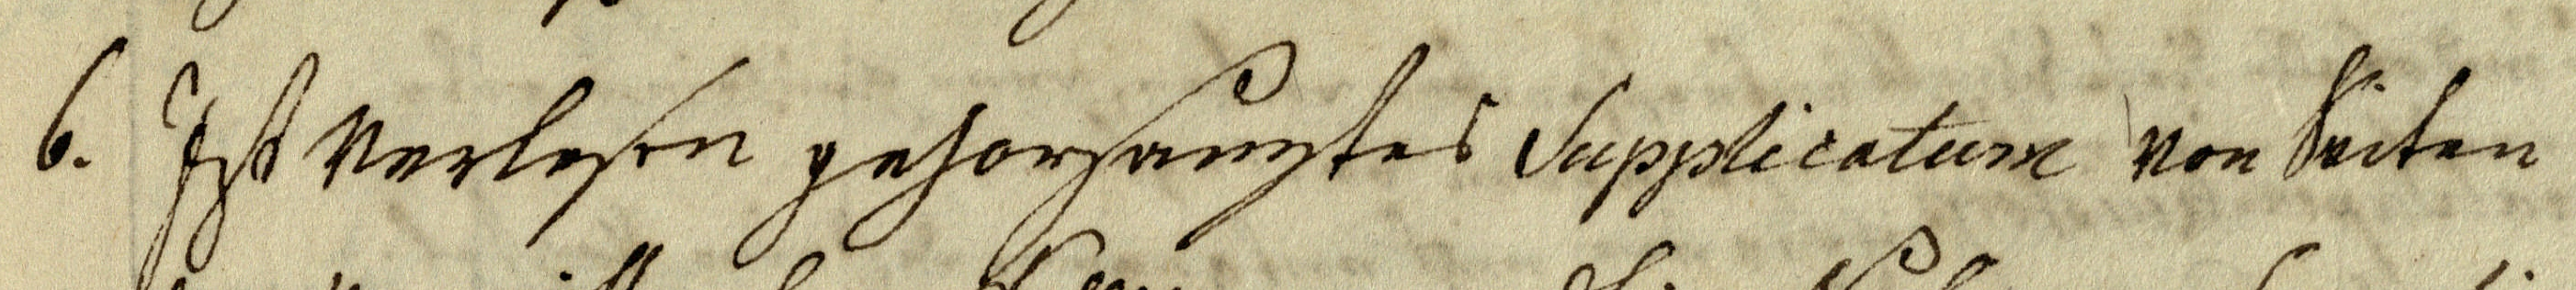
6. Ist verlesen gehorsamstes Supplicatum von Seiten
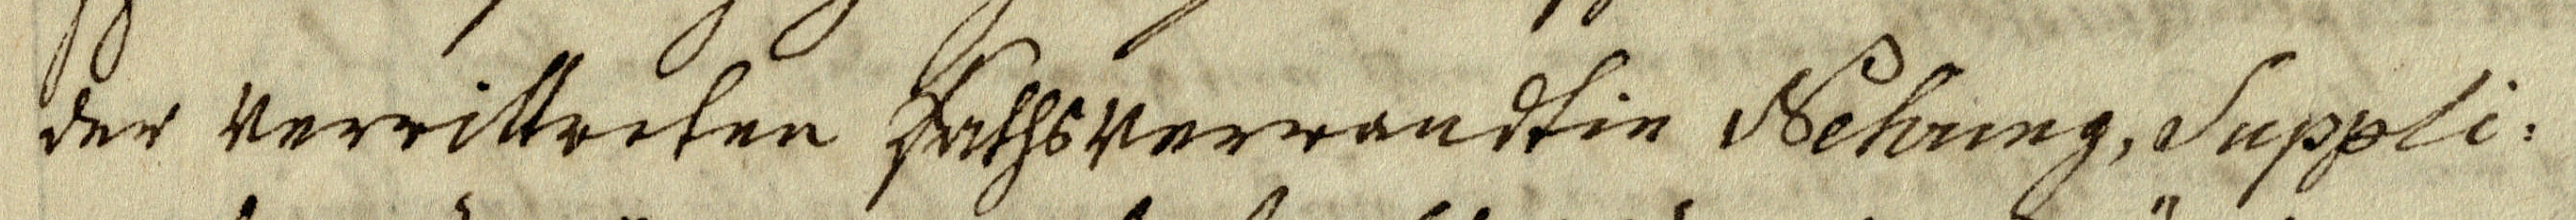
der verwittweten Rathsverwandtin Nehring, Suppli¬
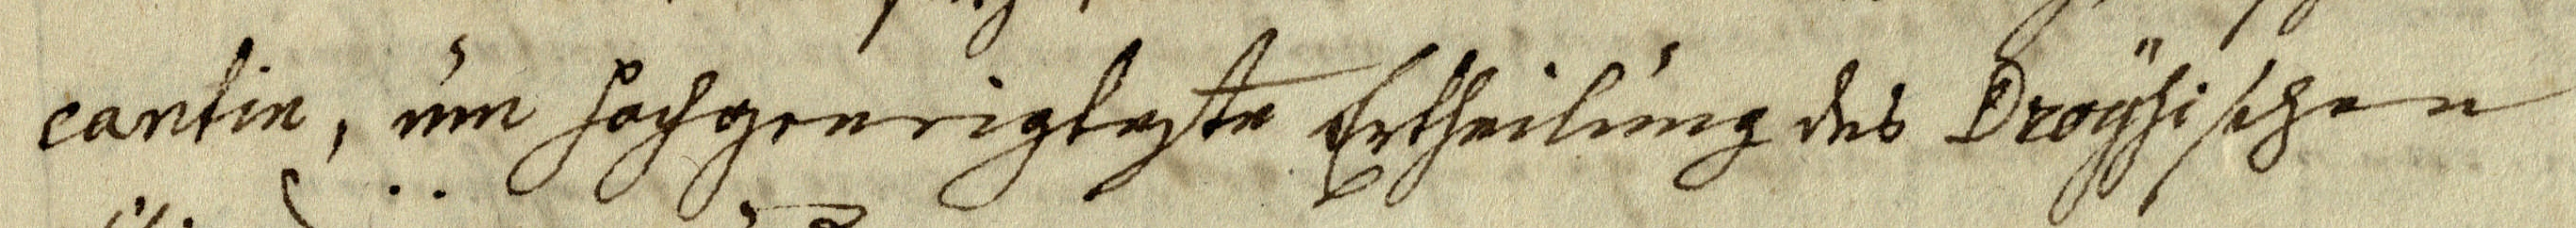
cantin, um hochgeneigteste Ertheilung des Droÿsischen
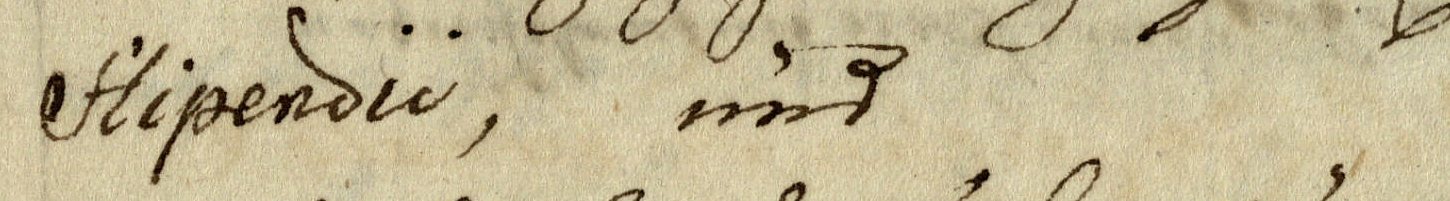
Stipendii, und
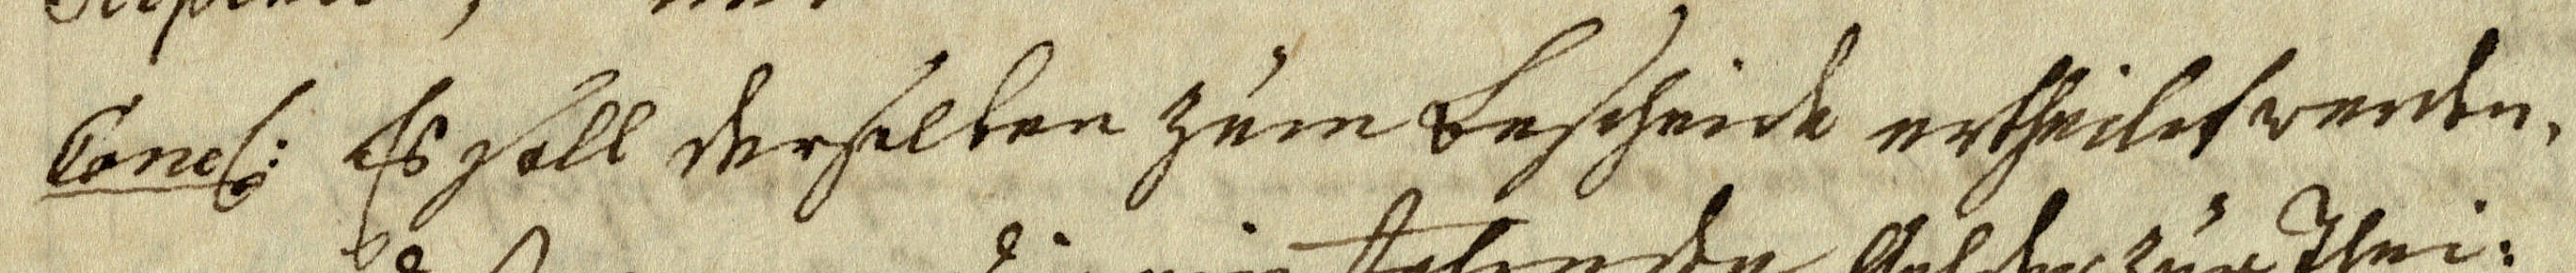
Concl: Es soll derselben zum Bescheide ertheilet werden,
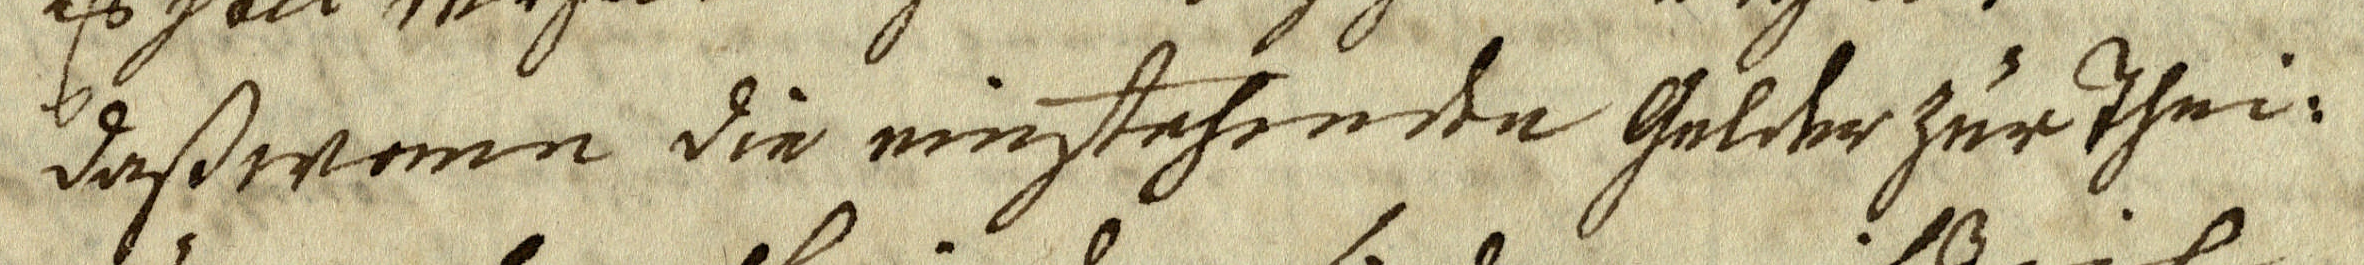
daß wann die einstehenden Gelder zur Thei¬
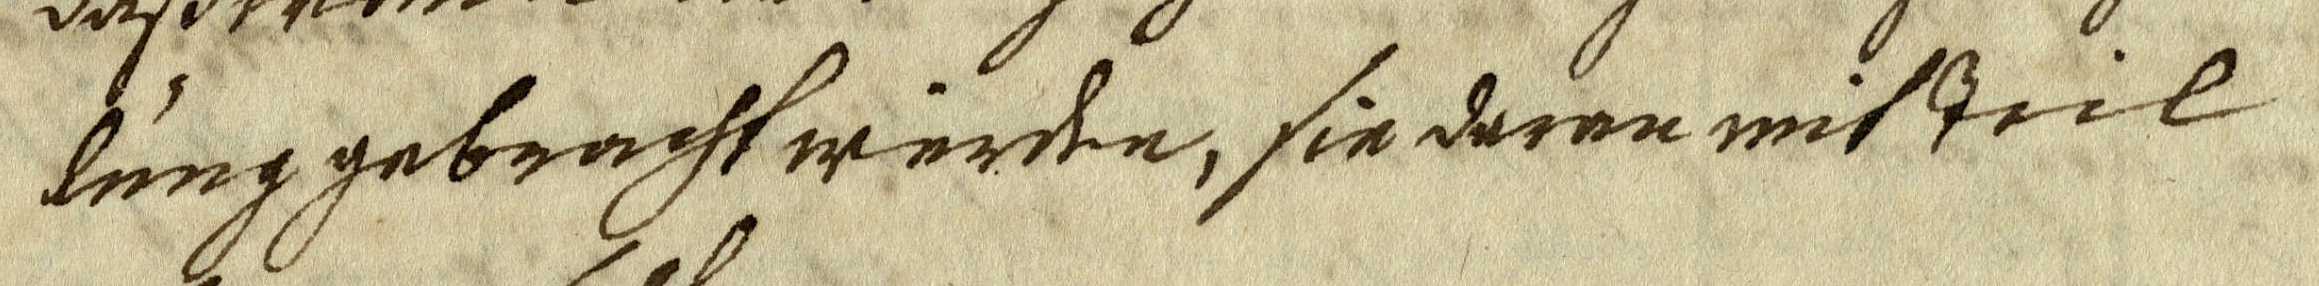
lung gebracht würden, sie daran mit teil
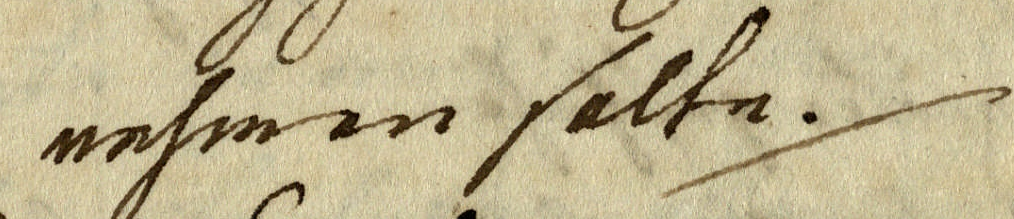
nehmen solte.
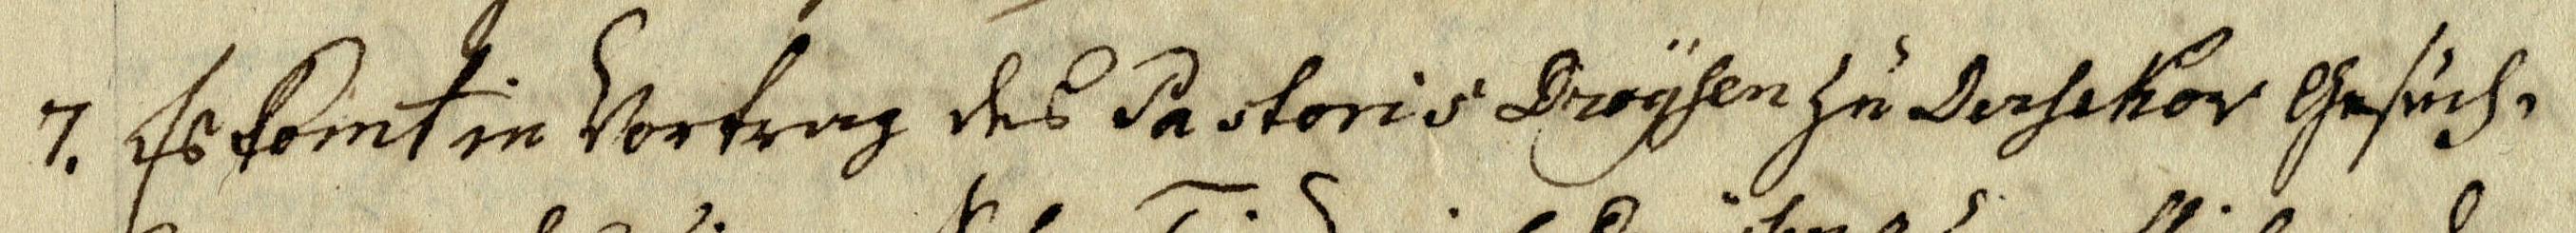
7. Es komt in Vortrag des Pastoris Droÿsen zu Dersekow Gesuch,
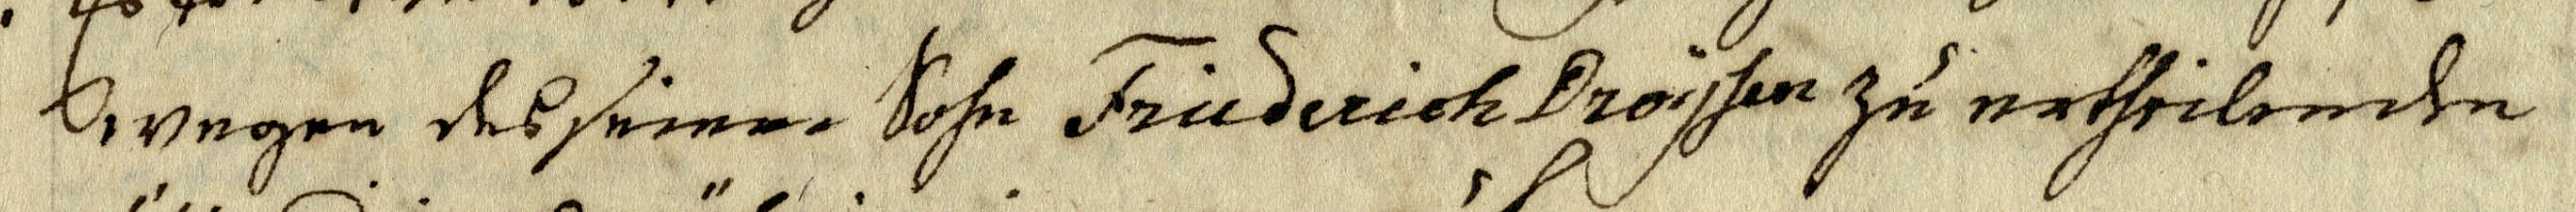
wegen des seinen Sohn Friedrich Droÿsen zu ertheilenden
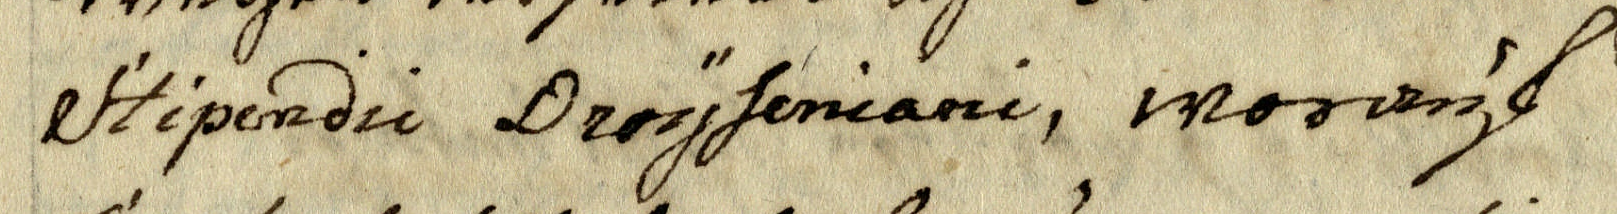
Stipendii Droÿseniani, worauf
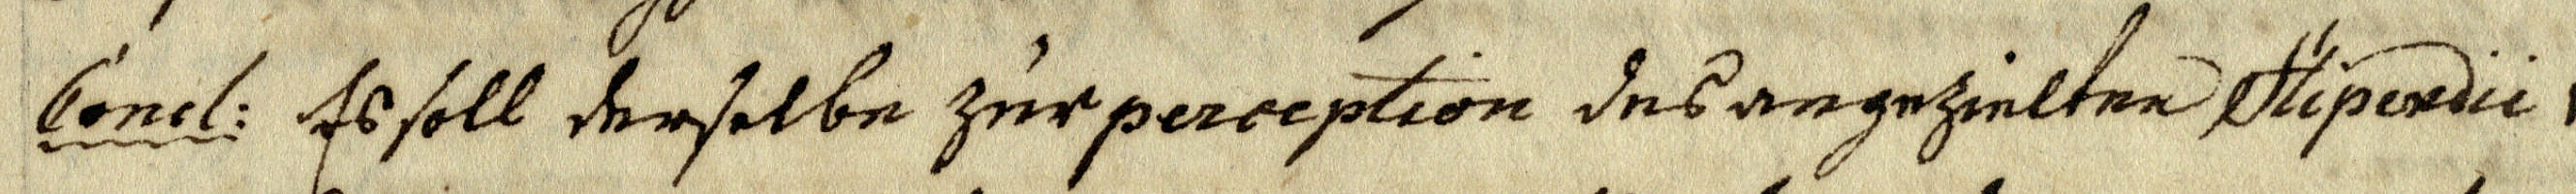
Concl. Es soll derselbe zur perception des angezielten Stipendii
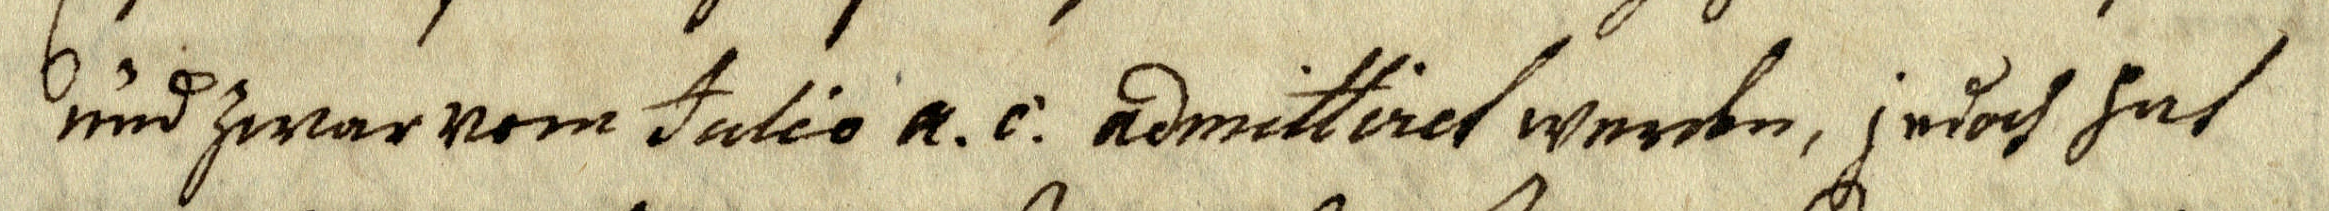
undzwarvom Julio a. c. admittiret werden, jedoch hat
